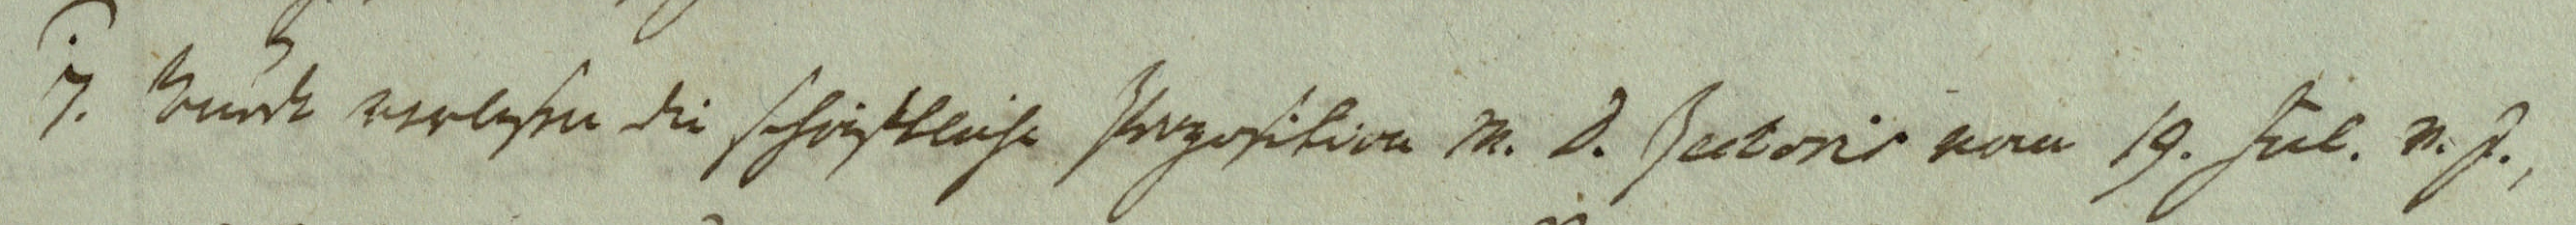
7. Wurde verlesen die schriftliche Proposition M. D. Rectoris vom 19. Jul. v. J.,
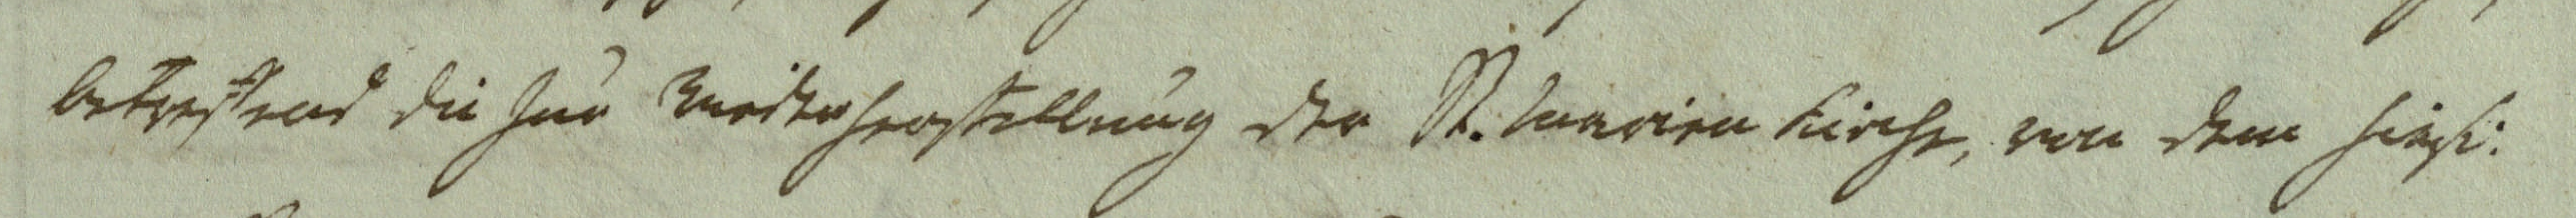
betreffend die zur Wiederherstellung der St. Marien Kirche, von dem hiesi¬
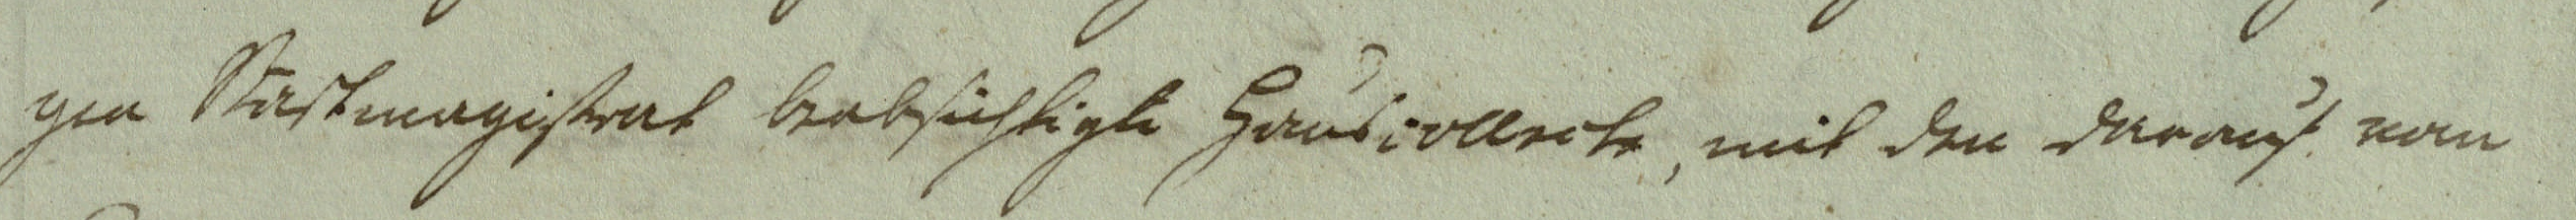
gen Stadtmagistrat beabsichtigte Hauscollecte, mit den darauf vom
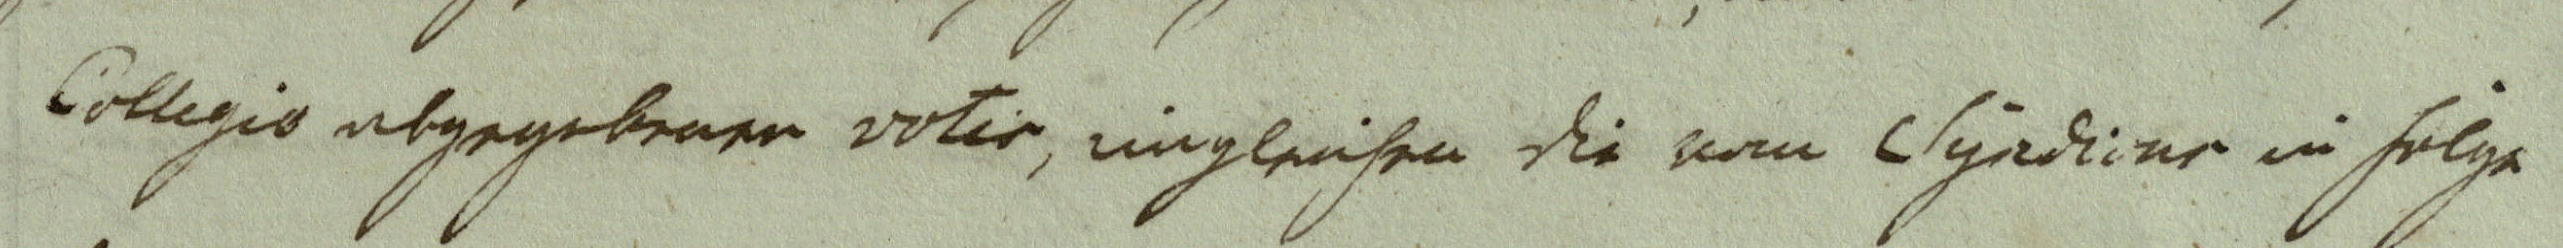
Collegio abgegebenen votis, imgleichen die vom Sÿndicus in Folge
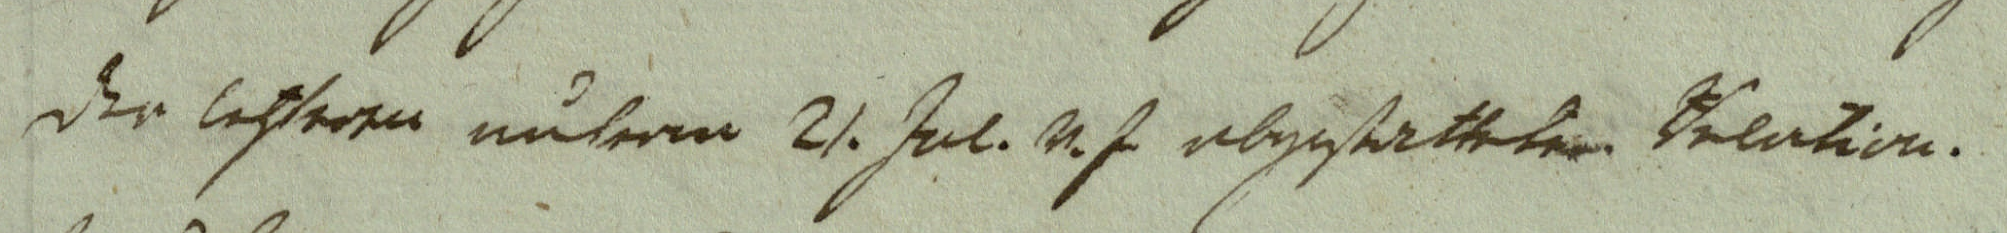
der letzteren unterm 21. Ju. v. J. abgestatteten Relation.
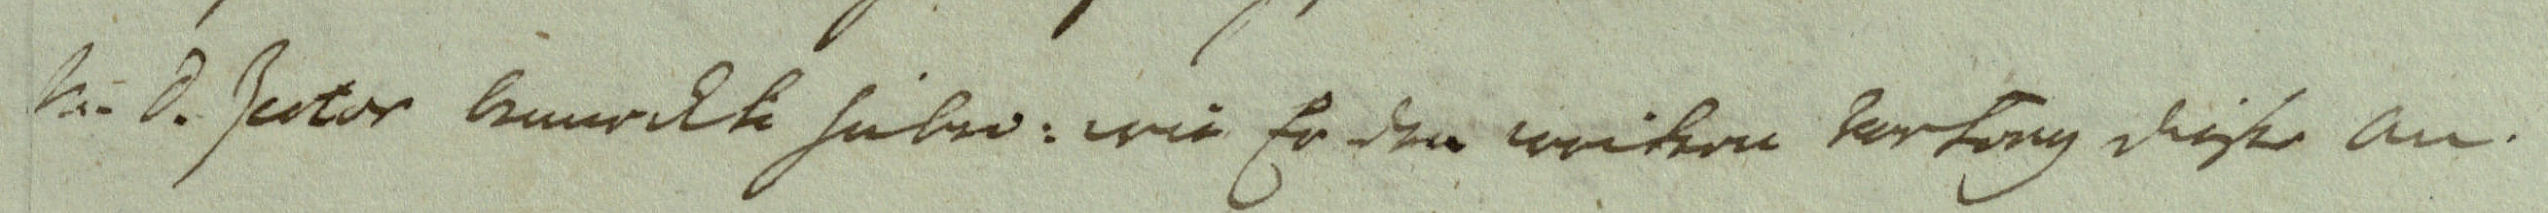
M. D. Rector bemerckte hiebei: wie Er den weitern Vortrag dieser An¬
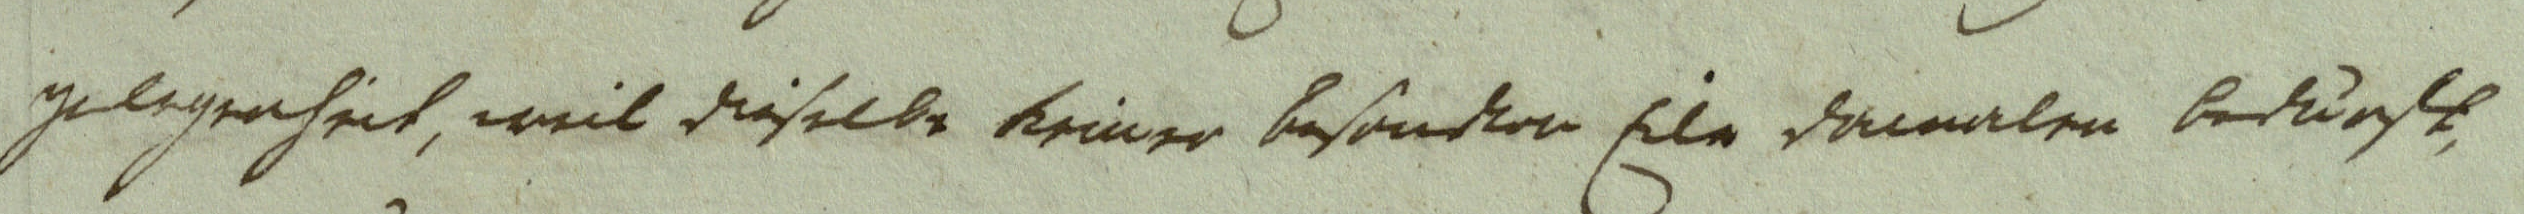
gelegenheit, weil dieselbe keiner besondern Eile damalen bedurfte,
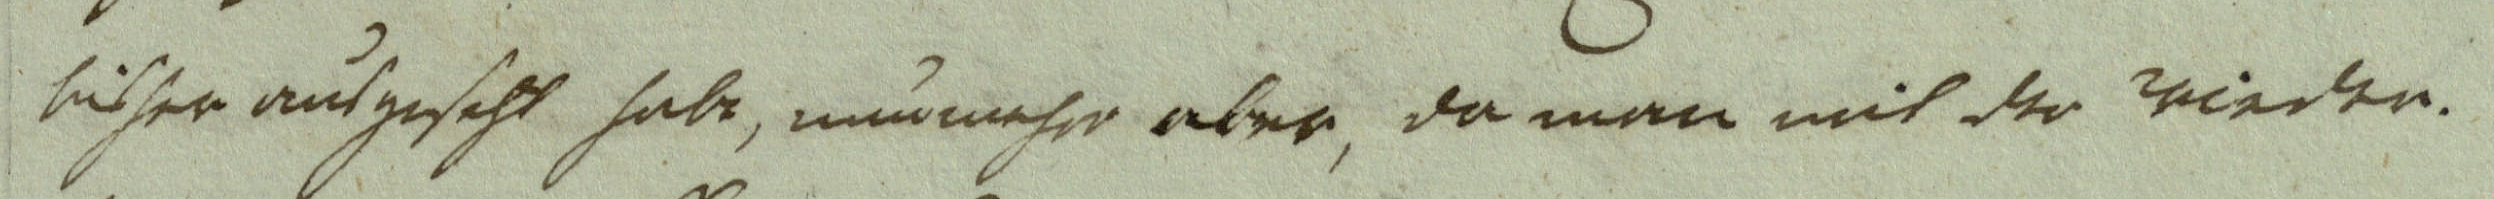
bisher ausgesetzt habe, nunmehro aber, da man mit der Wieder¬
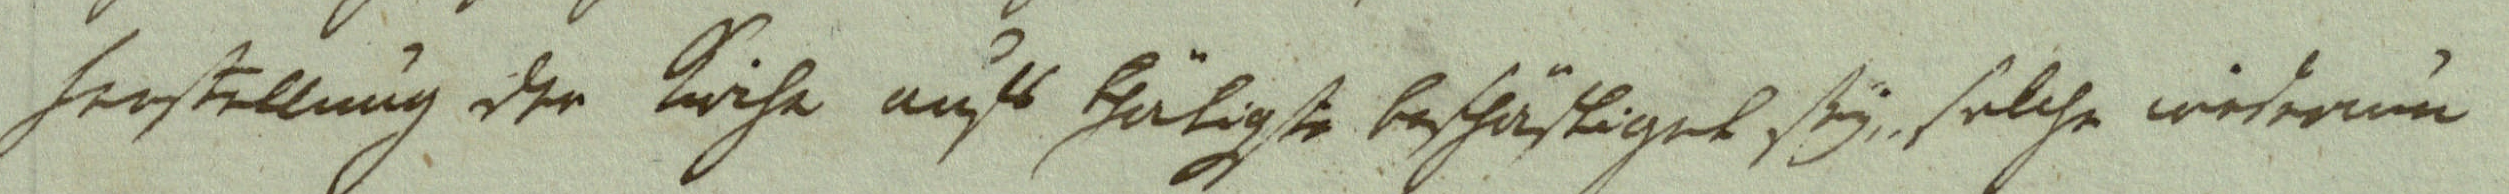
herstellung der Kirche aufs thätigste beschäftiget seÿ, solche wiederum
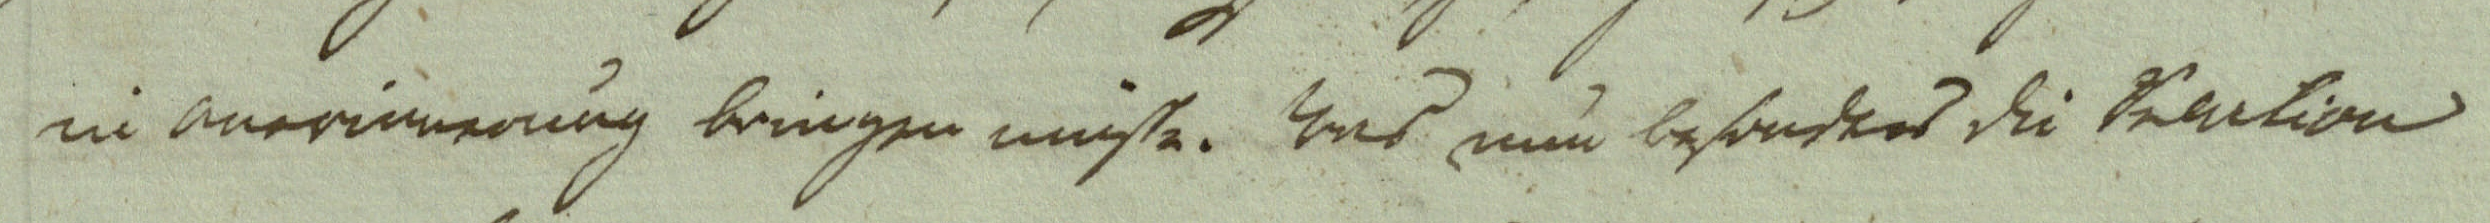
in Anerinnerung bringen müsse.Was nun besonders die Reaction
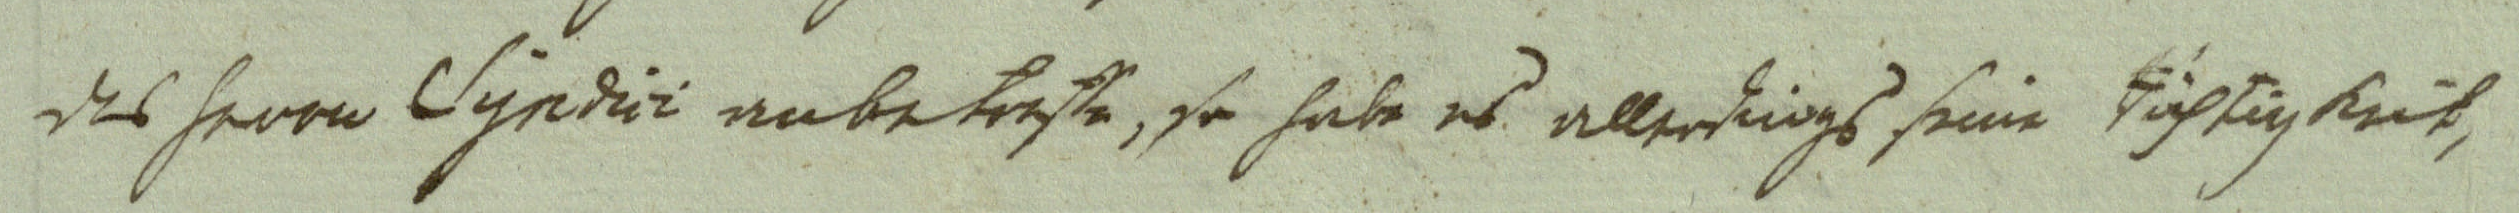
des Herrn Sÿndici anbetreffe, so habe es allerings seine Richtigkeit,
